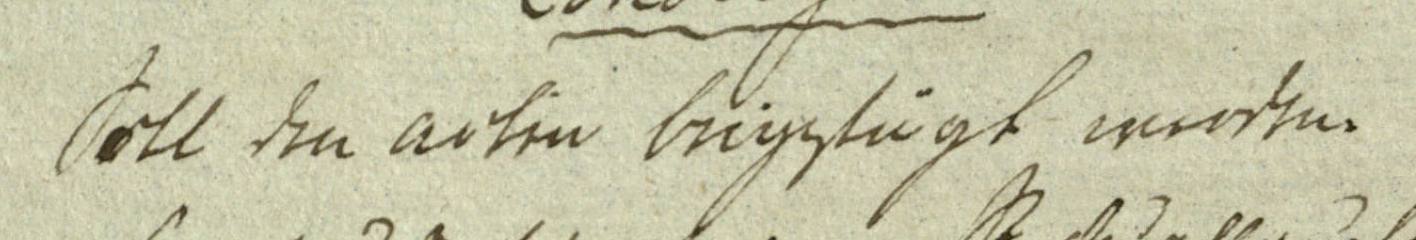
Soll den Acten beigefügt werden.
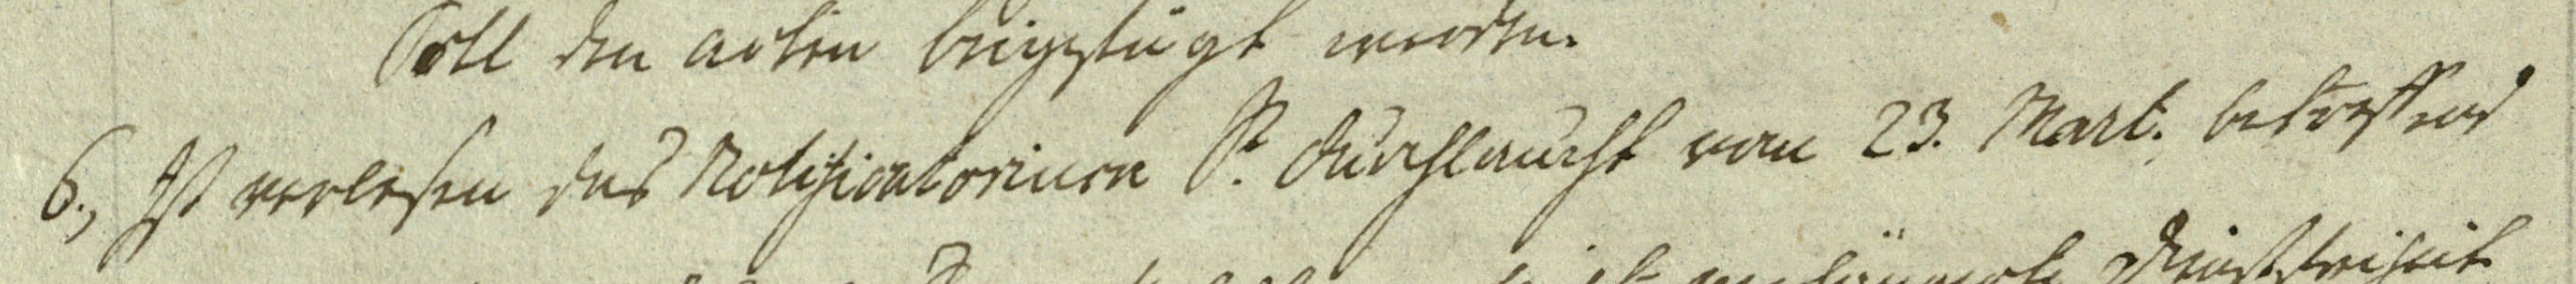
6., Ist verlesen das Notificatorium Sr. Durchlaucht vom 23. Mart. betreffend
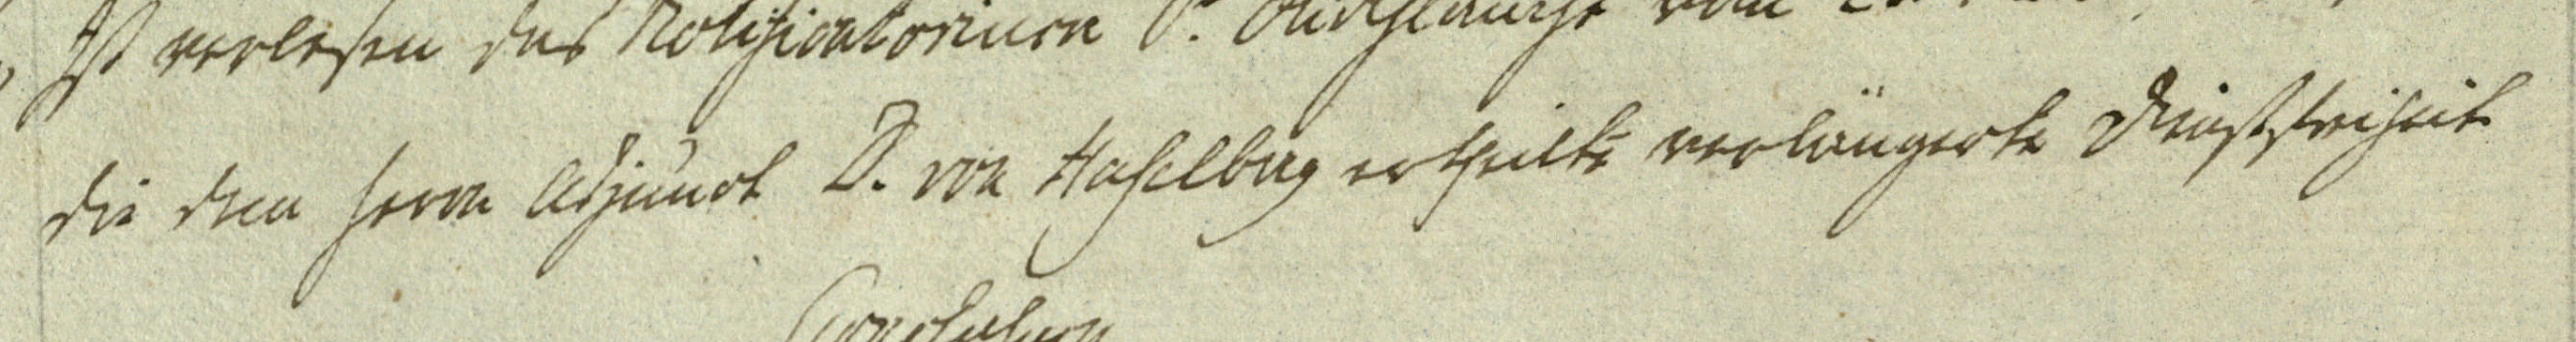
die dem Herrn Adjunct D. von Haselberg ertheilte verlängerte Dienstfreiheit
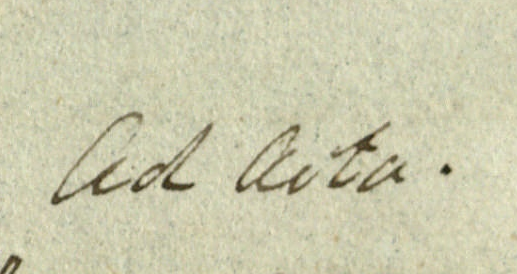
Ad Acta.
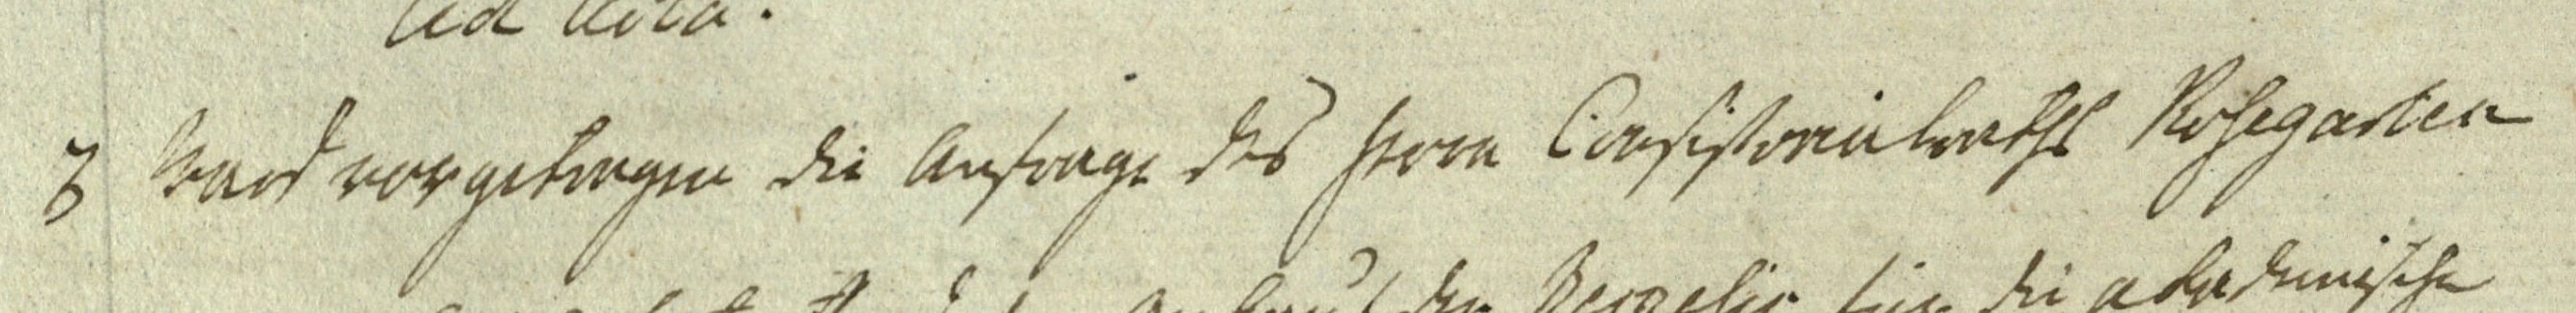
7, Ward vorgetragen die Anfrage des Herrn Consistorialtraths Kosegarten
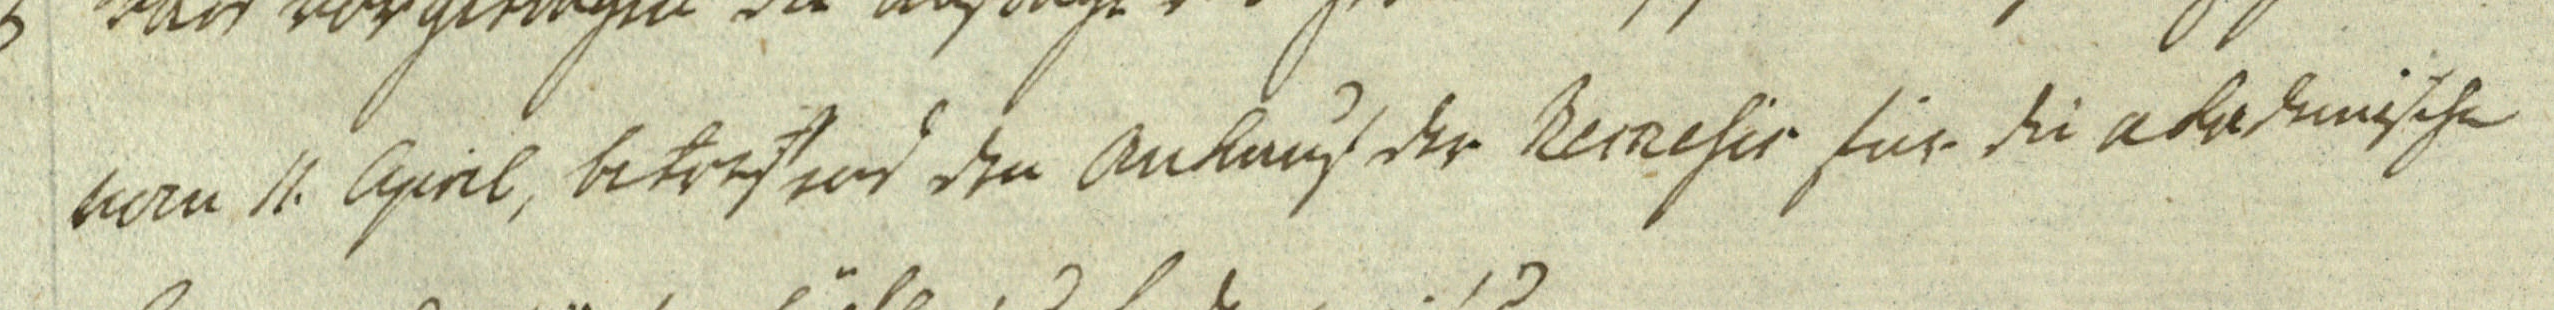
vom 11. April, betreffend den Ankauf der Nemesis für die akademische
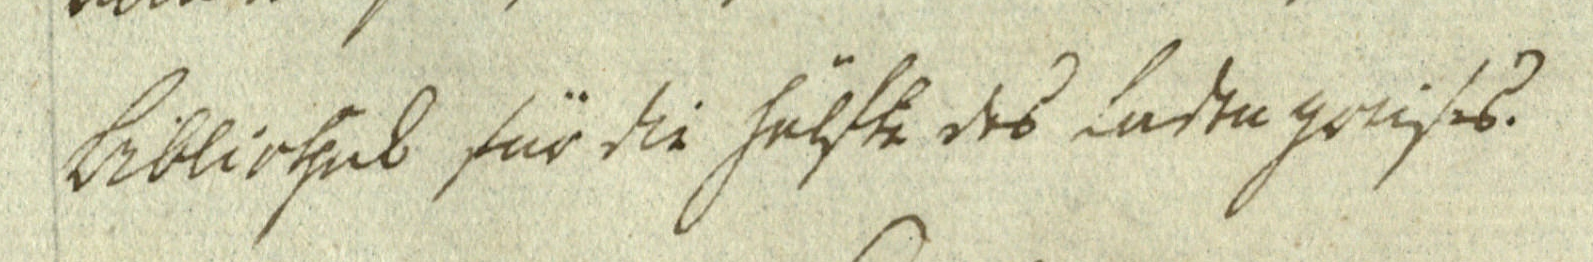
Bibliothek für die Hälfte des Ladenpreises.
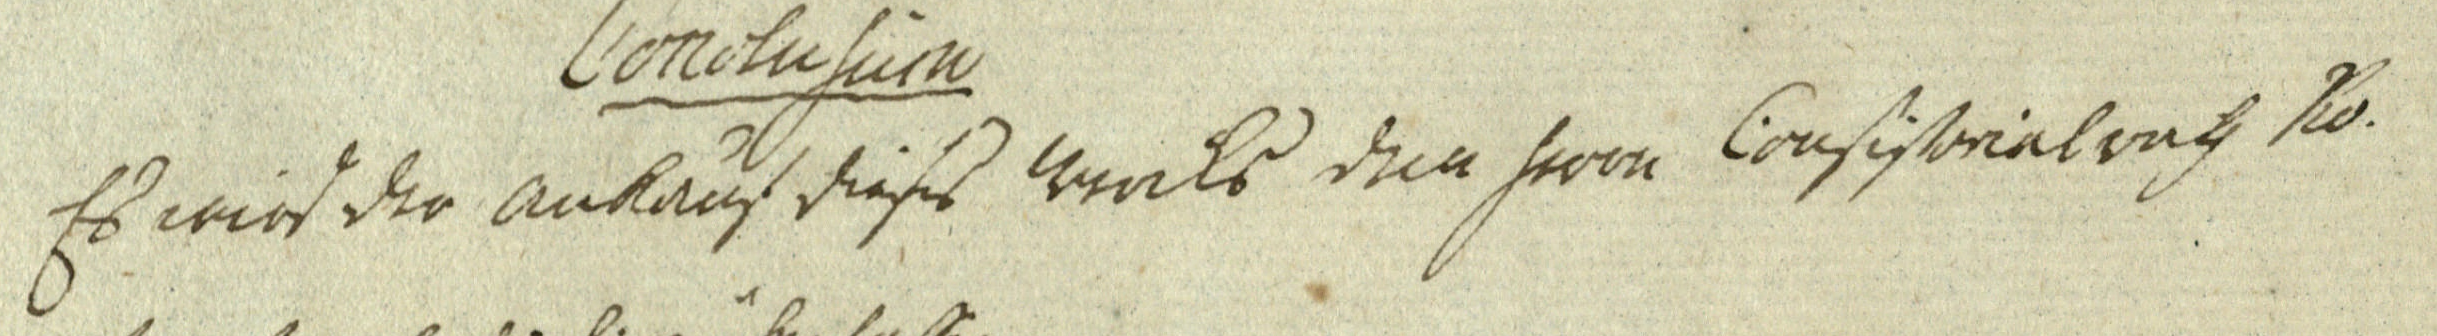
Er wird der Ankauf dieses Wercks dem Herrn Consistorialrath Ko¬
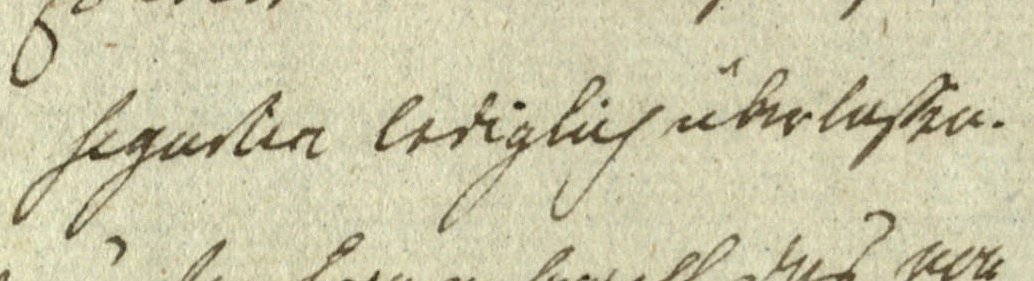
segarten lediglich überlassen.
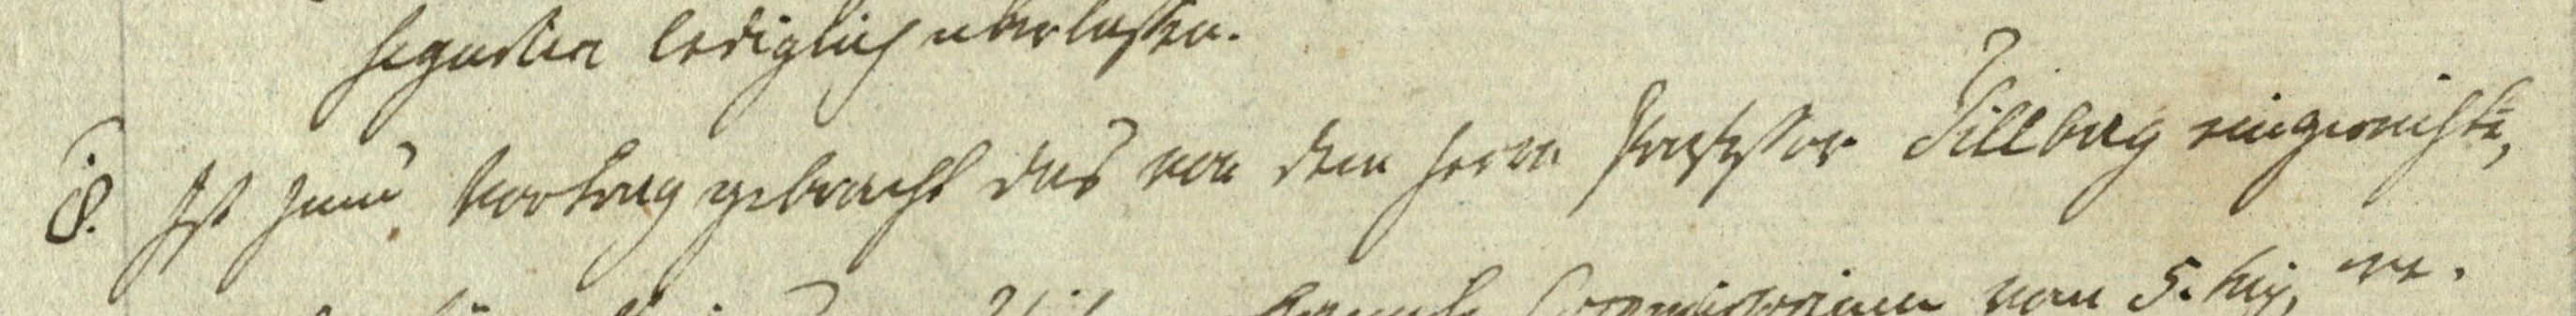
8. Ist zum Vortrag gebracht das von dem Herrn Professor Tillberg eingereichte,
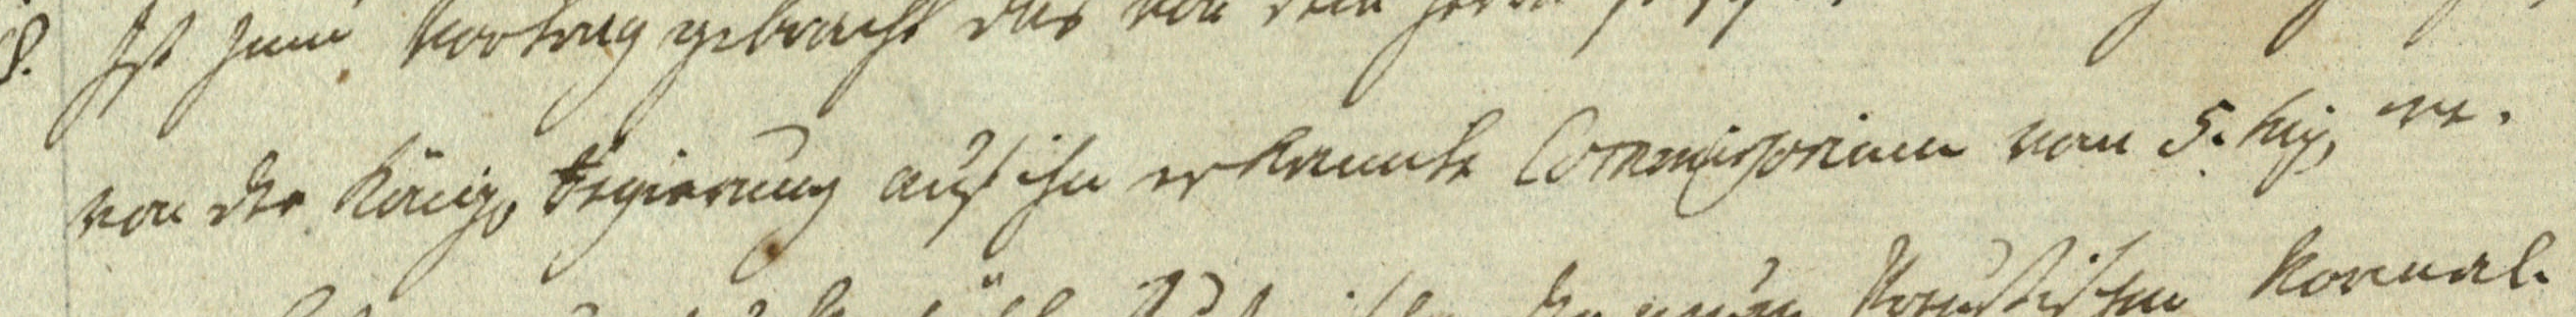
von der Königl. Regierung auf ihn erkannte Commissorium vom 5. huj, we¬
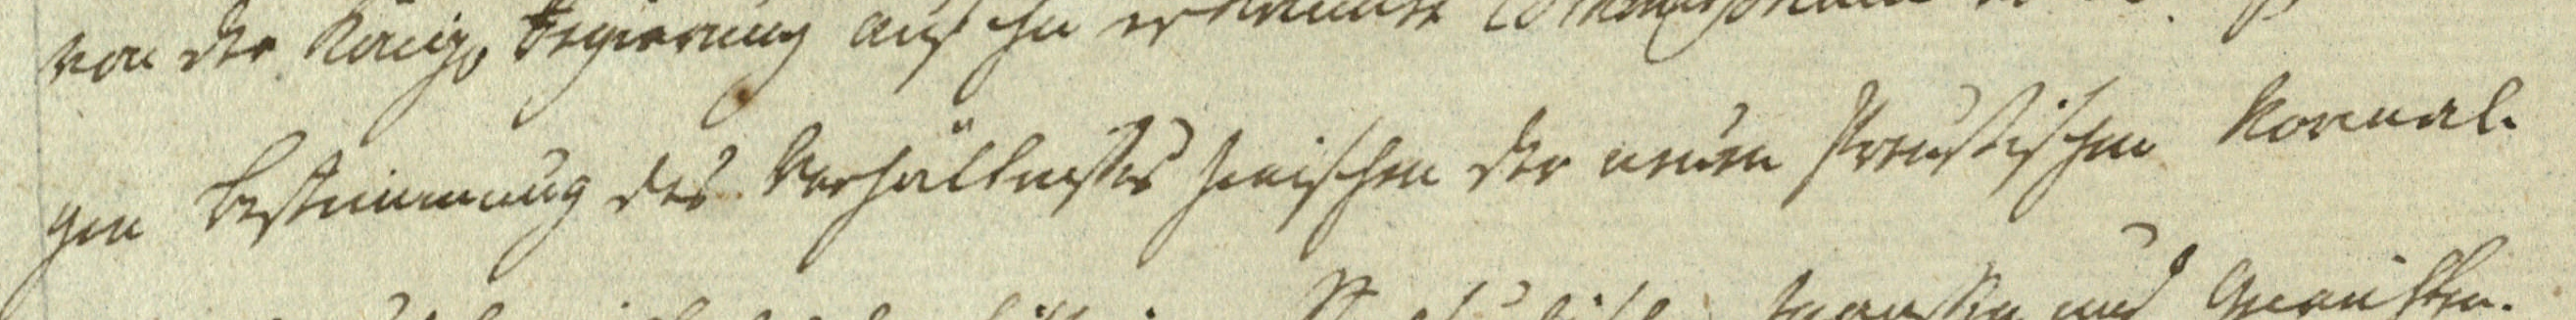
gen Bestimmung des Verhältnisses zwischen der neuen Preußischen Normal¬
